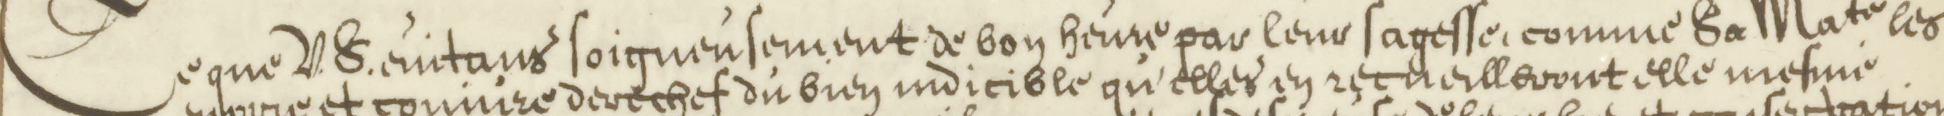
Ce que V.S. euitans soigneusement de bon heure par leur sagesse, comme Sa Mate. les
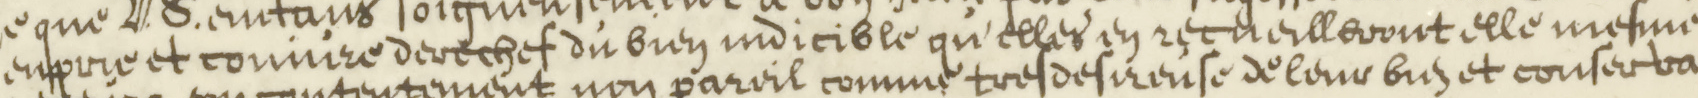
enprie et coniure derechef du bien indicible qu‛elles en recueilleront elle mesme
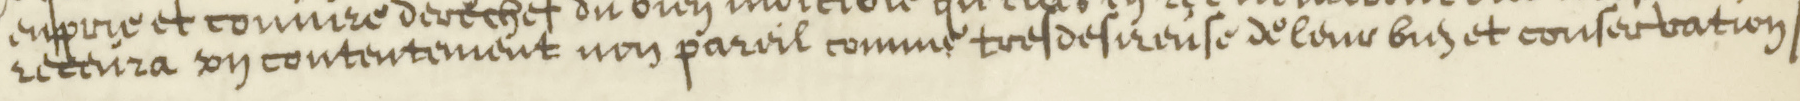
receura vn contentement non pareil comme tres desireuse de leur bien et conservation.
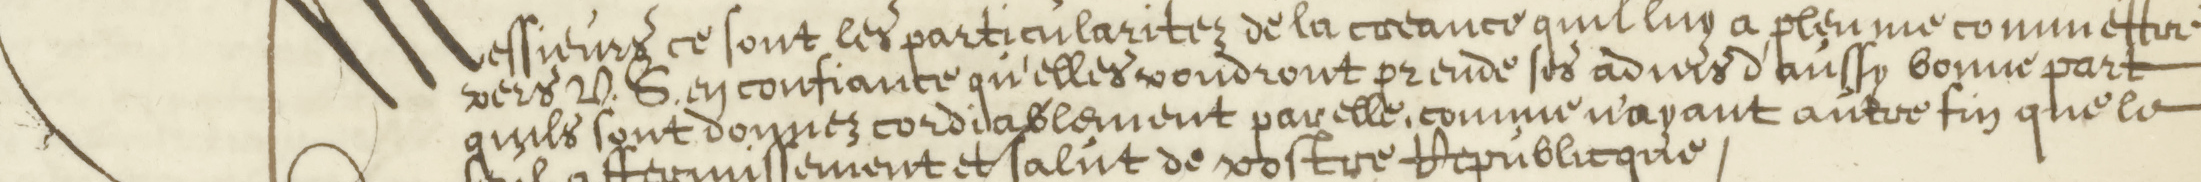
Messieurs ce sont les particularitez de la creance quil luy a pleu me commettre
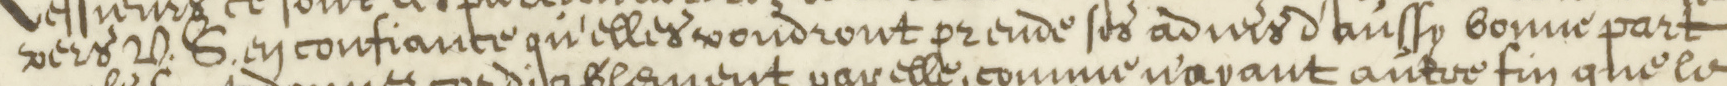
vers V.S. en confiance qu‛elles voudront prendre ses aduis d' aussy bonne part
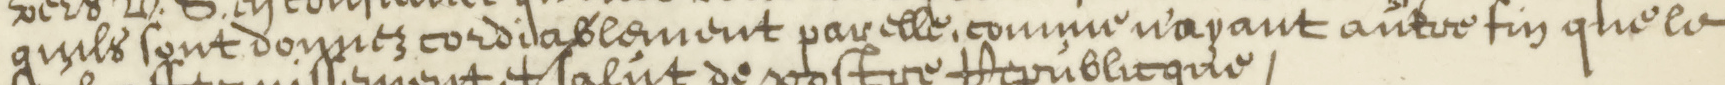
quils sont donnez cordiablement par elle, comme n‛ayant autre fin que le
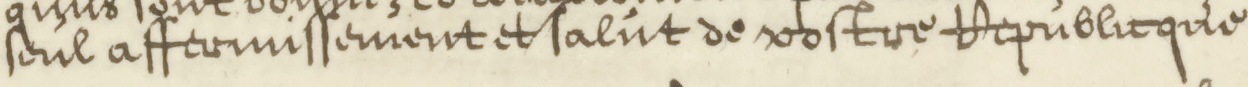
seul affermissement et salut de vostre Republicque.
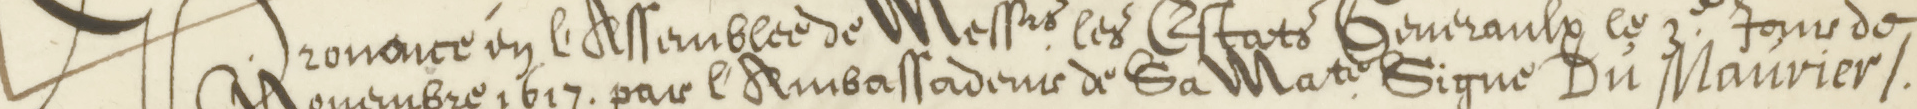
Prononcé en l‛Assemblee de Messrs. les Estats Generaulx le 3e. Jour de
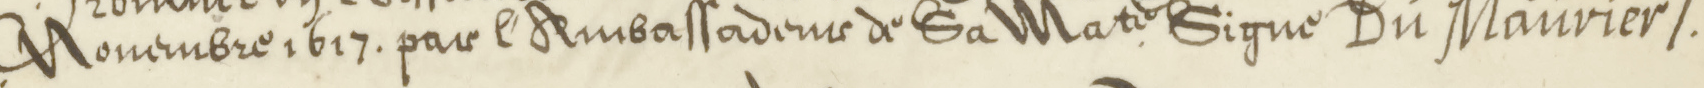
Nouembre 1617. par l‛ Ambassadeur de Sa Mate. Signe Du Maurier.
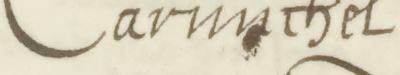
Carmichel
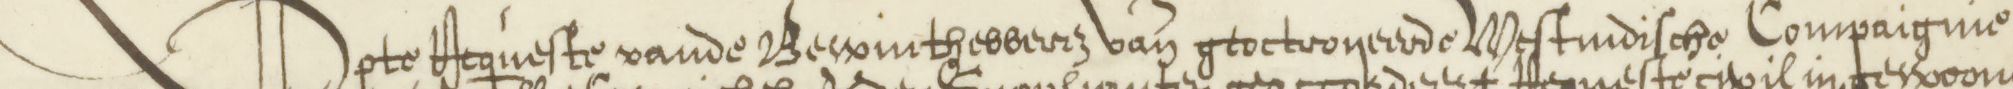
Opte Requeste vande Bewinthebberen van geoctroyeerde Westindische Compaignie
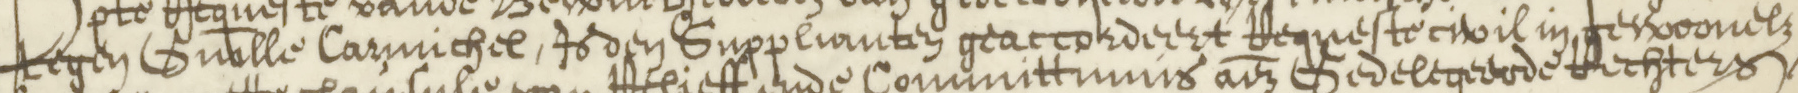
tegen Guille Carmichel, Is den Supplianten geaccordeert Requeste civil in gewoonel
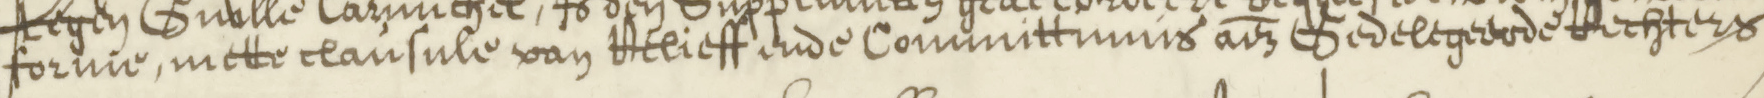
forme, mette clausule van Relieff ende Committimus aen Gedelegeerde Rechters
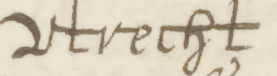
Utrecht
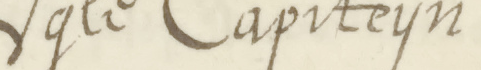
Vgle Capiteijn
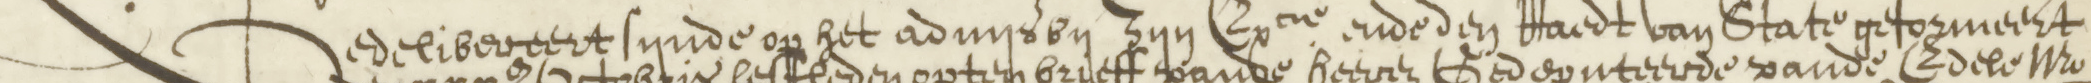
Gedelibereert synde op het aduys by Zyn Excie. ende den Raedt van State geformeert
